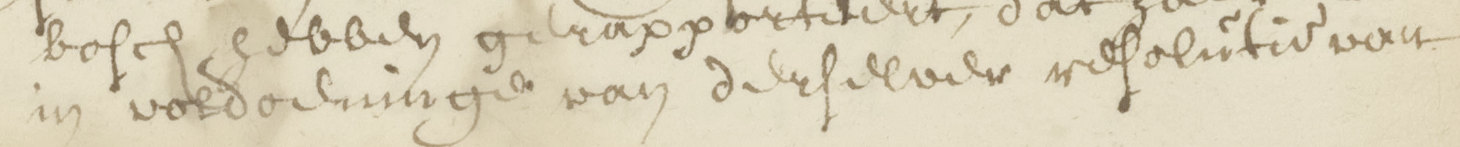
in voldoeninge van derselver resolutie van
